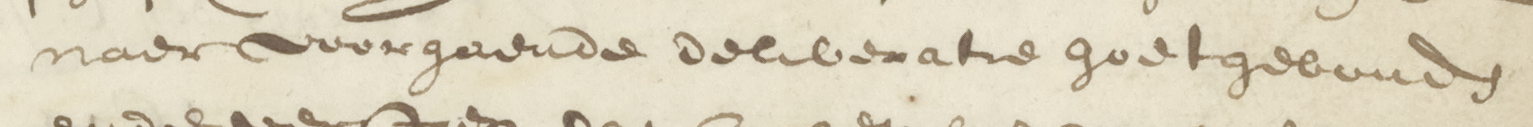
naer voorgaende deliberatie goetgevonden
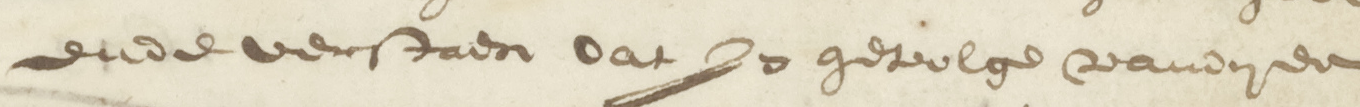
ende verstaen dat in gevolge vandyer
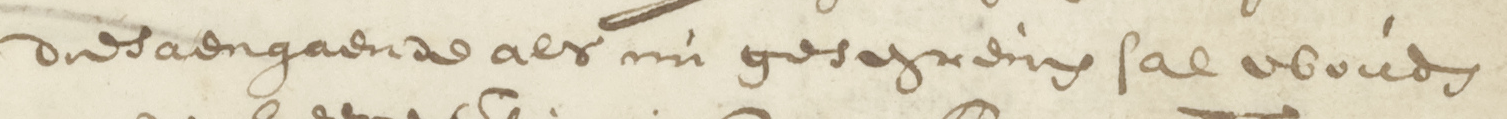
diesaengaende als nu geschreven sal wouden
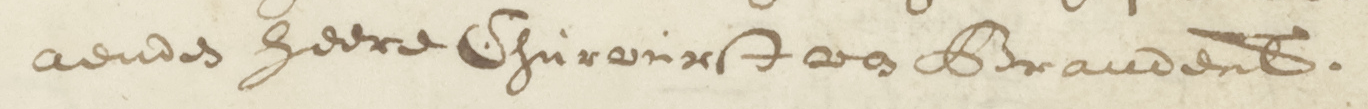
aenden heere Churvurst van Brandenb.
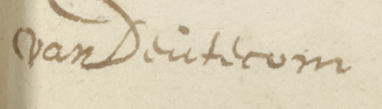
van Deutecom
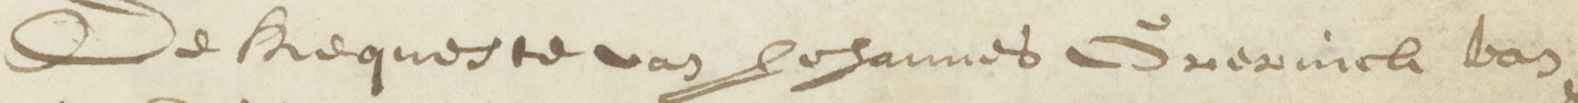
De Requeste van Johannes Grevinck van
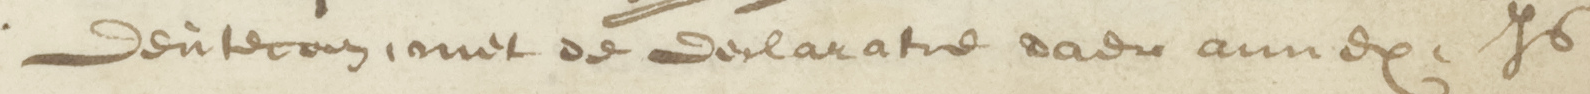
Deutecom, met de Declaratie daer annex, Is
